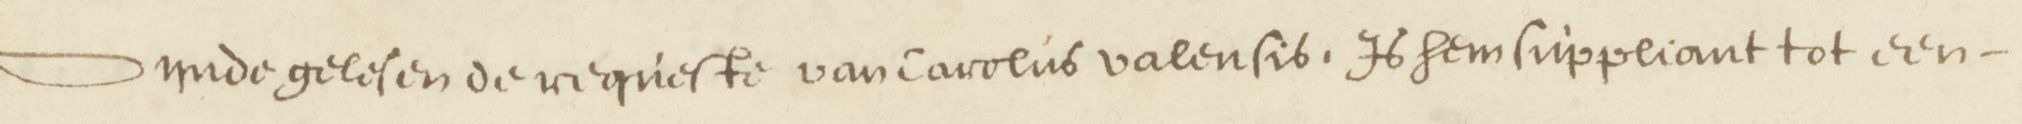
Synde gelesen de requeste van Carolus valensis. Is hem suppliant tot een -
